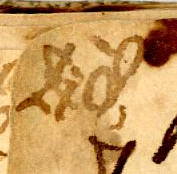48
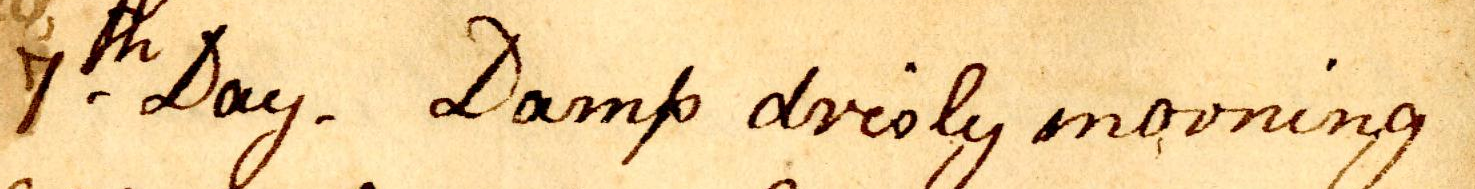7^th. Day. Damp drisly morning
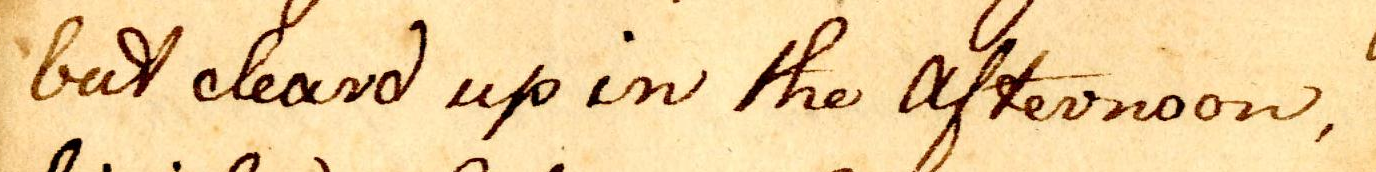but cleard up in the Afternoon,
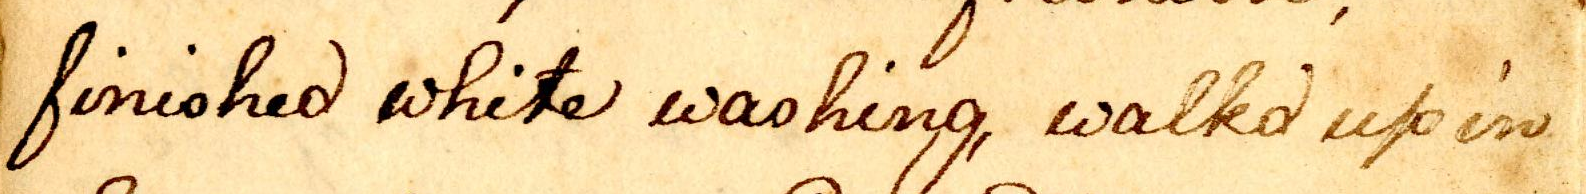finished white washing, walkd up in
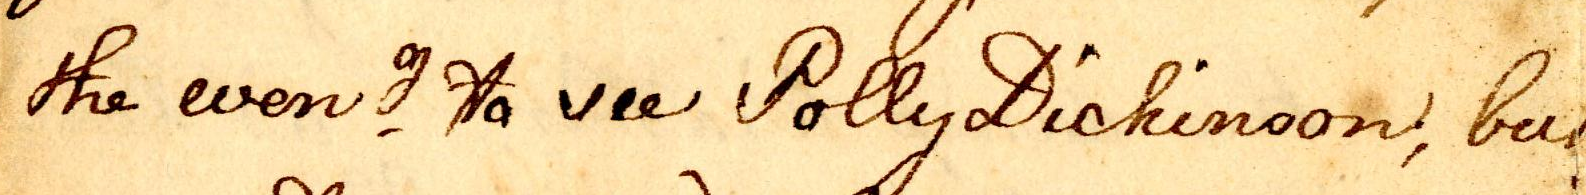the even^g to see Polly Dickinson, but
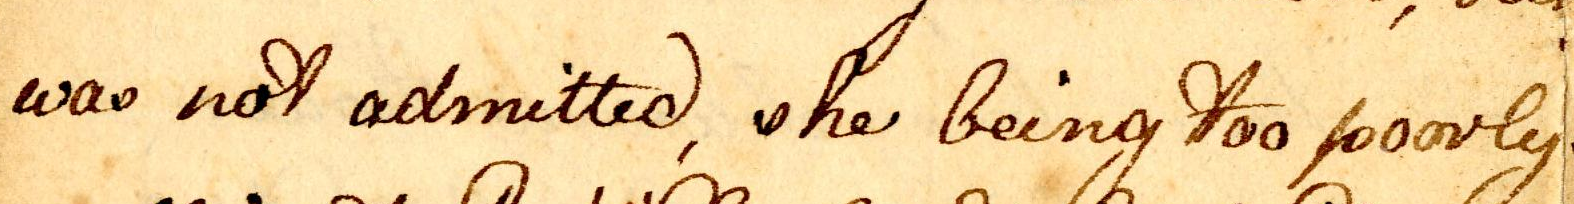was not admitted, she being too poorly
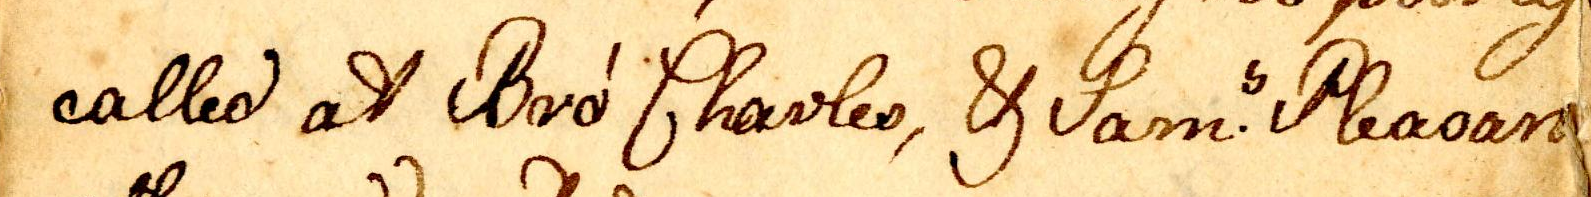called at Bro' Charles, & Sam^y Pleasan
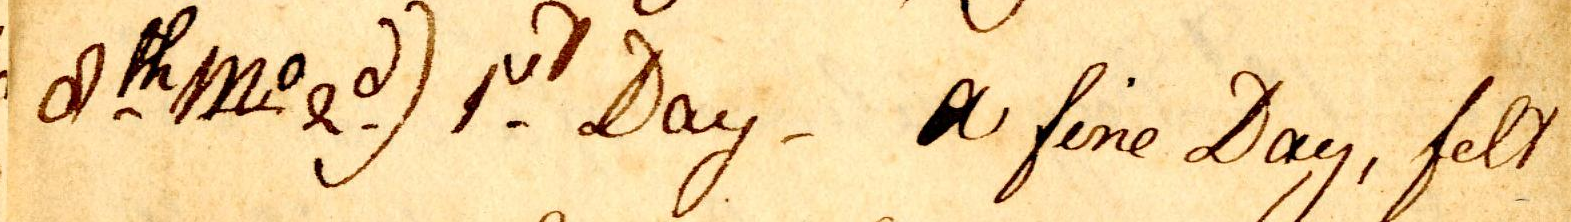8^th. M^o 2^d.) 1^st. Day- A fine Day, felt
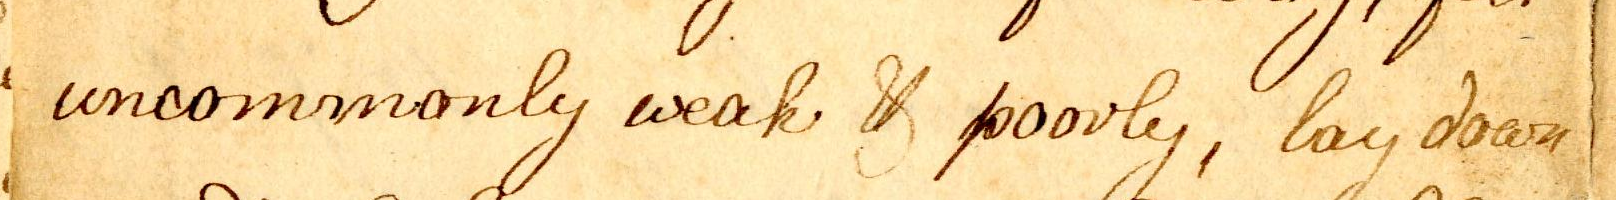uncommonly weak & poorly, lay down
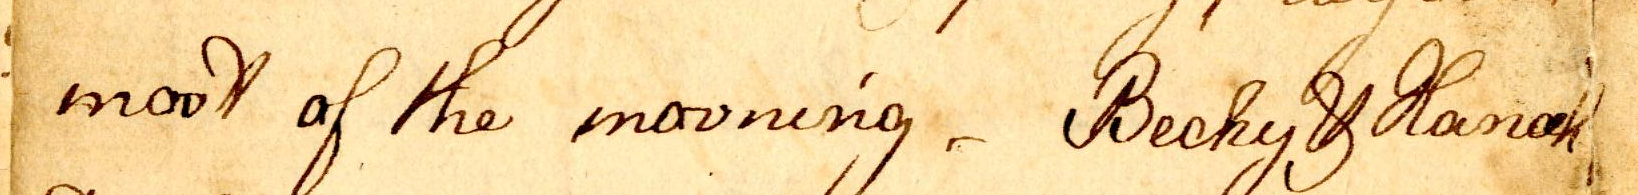most of the morning- Becky & Hanah
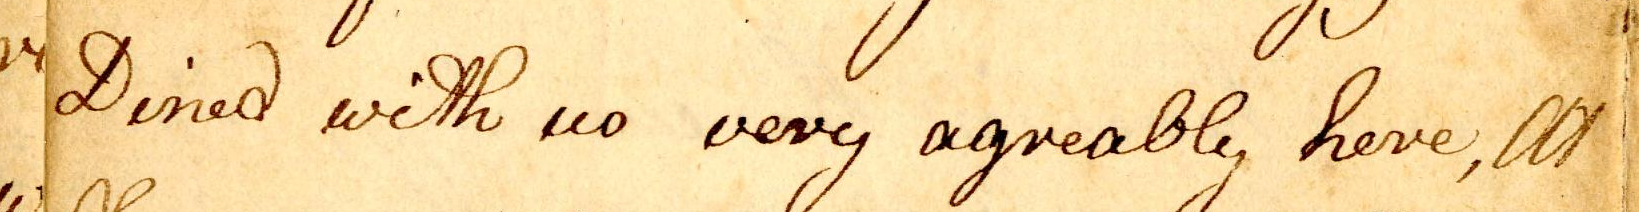Dined with us very agreably here, At
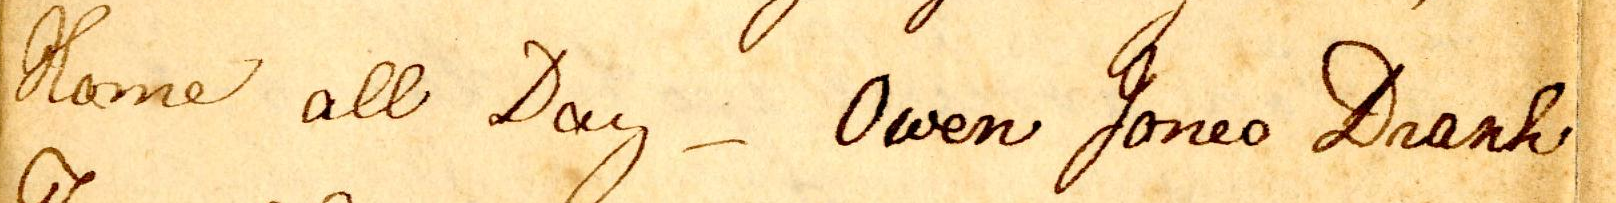Home all Day- Owen Jones Drank
